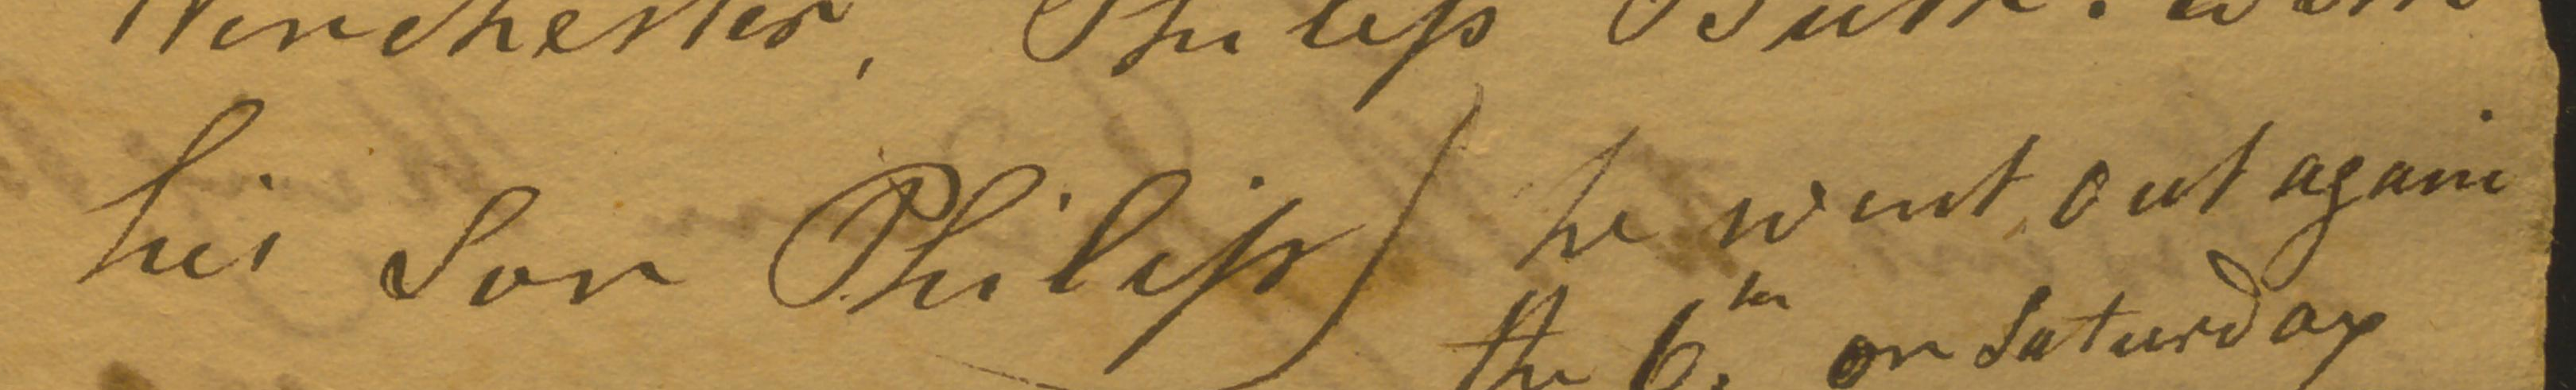his Son Philip) he went out again
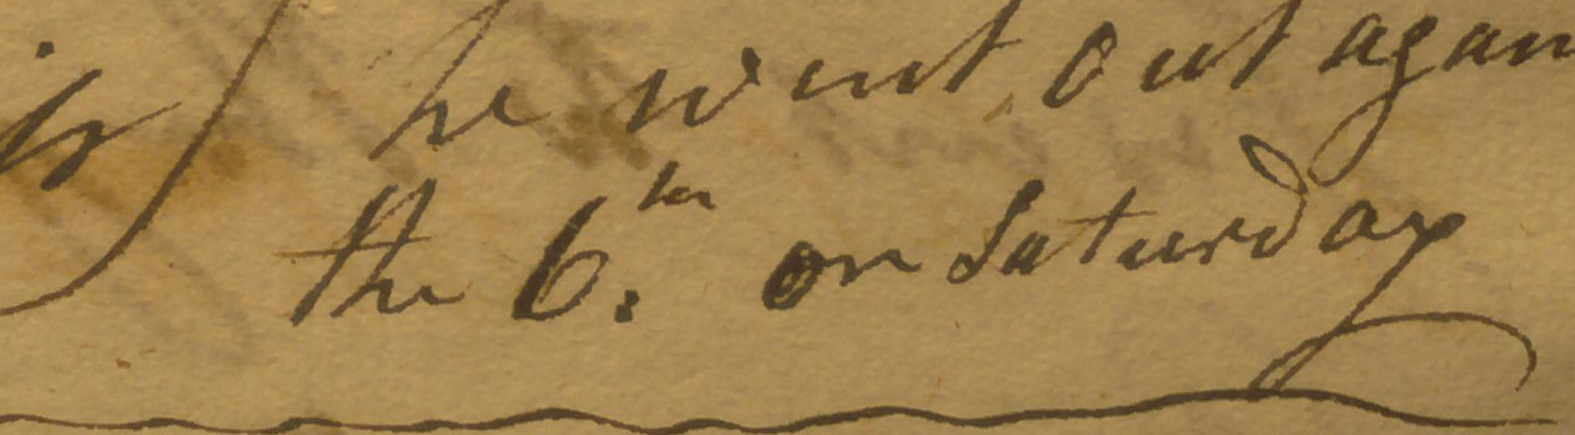the 6^th. on Saturday
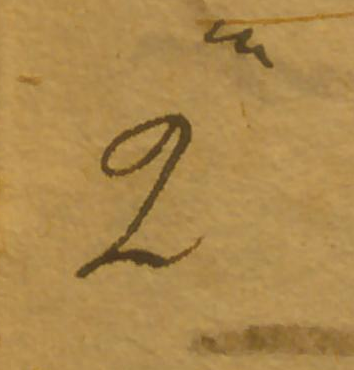2^th
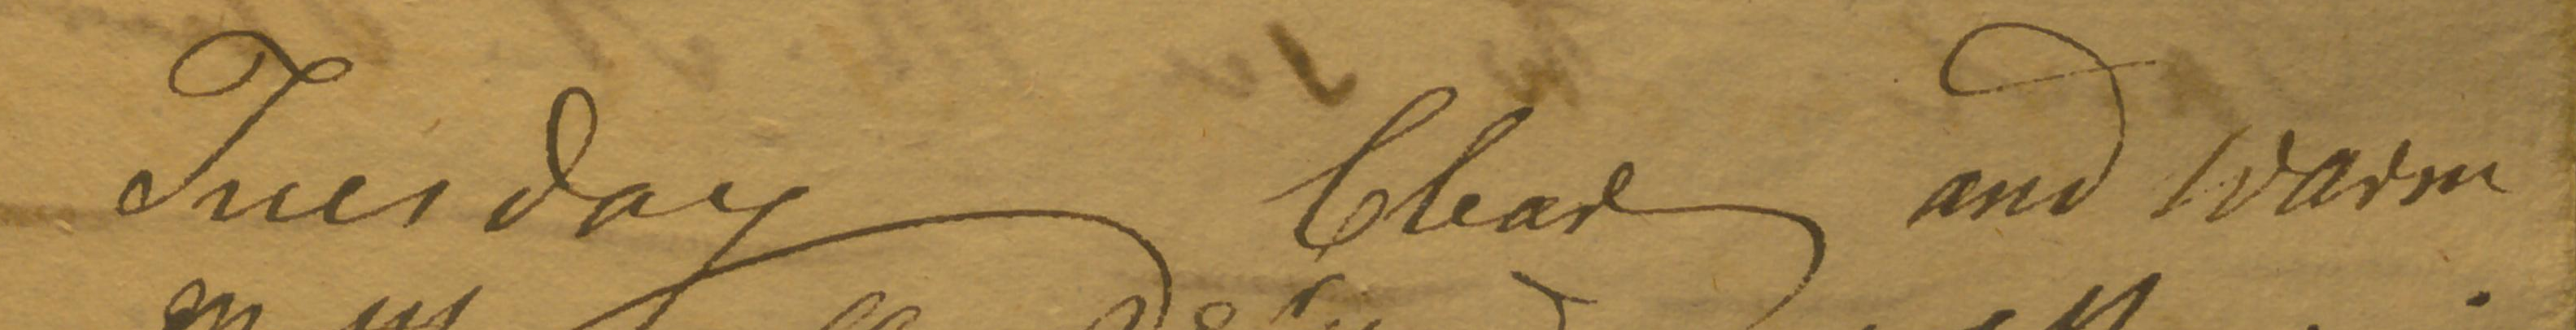Tuesday- Clear and Warm
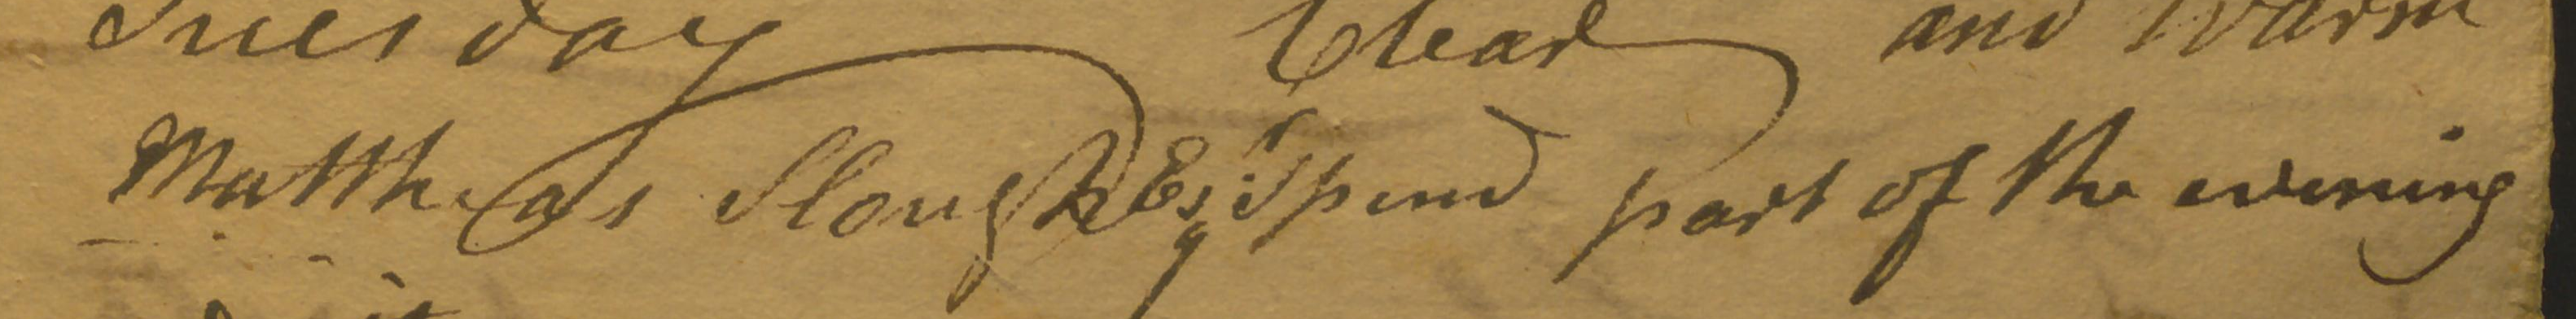Matthias Slough Esq^r. spend part of the evening
